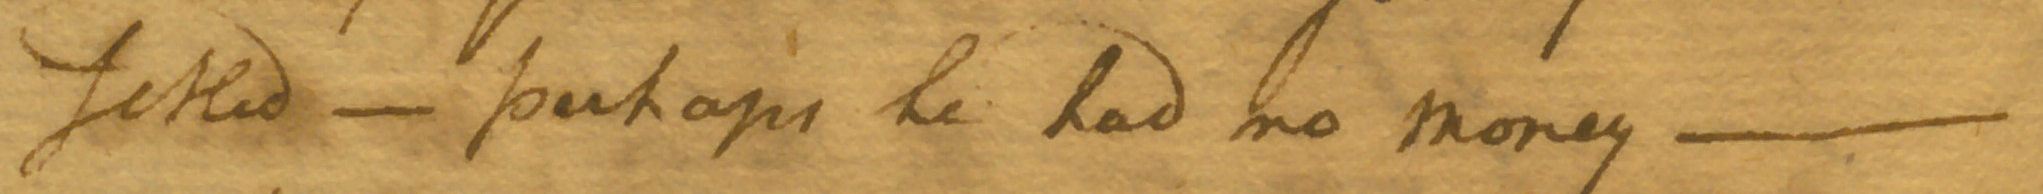setled- perhaps he had no money-
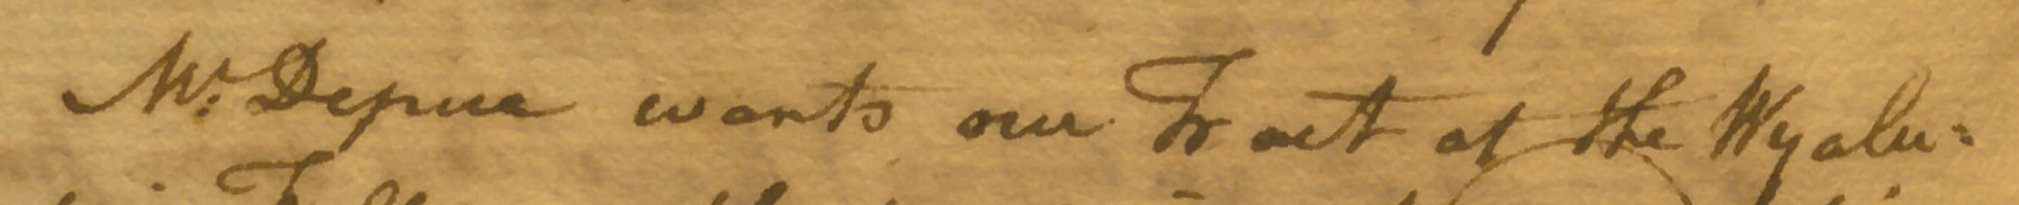M^r: Depue wants our Tract at the Wyalu-
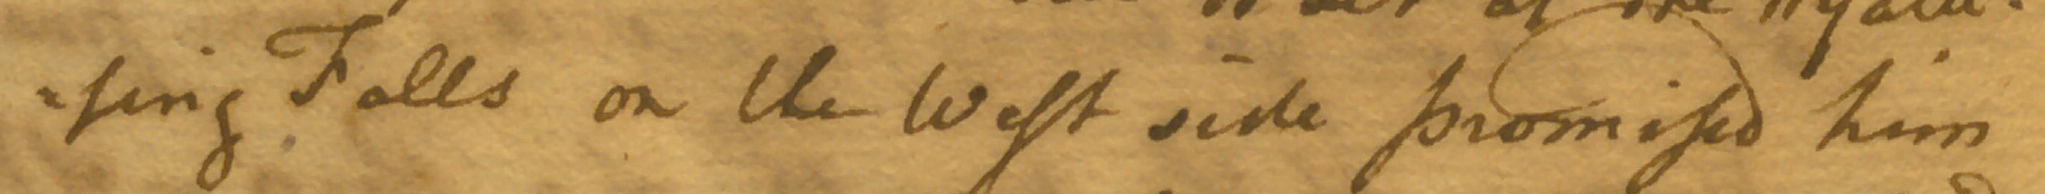-sing Falls on the West side promised him
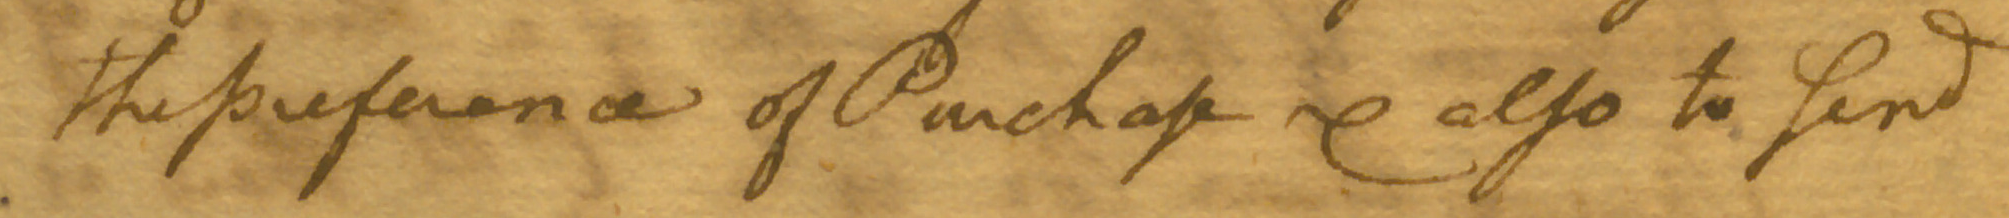the preference of Purchase & also to send
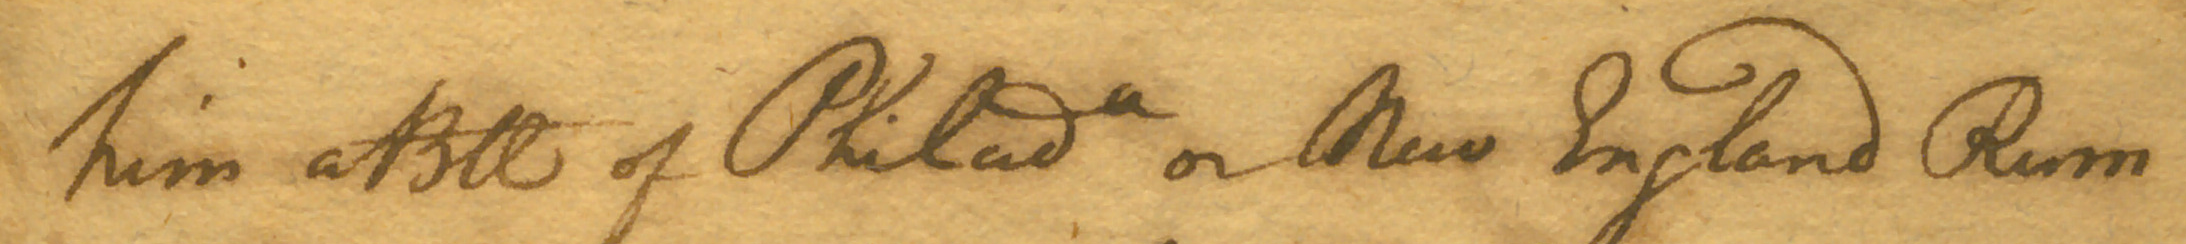him a Btl of Philad^a or New England Rum
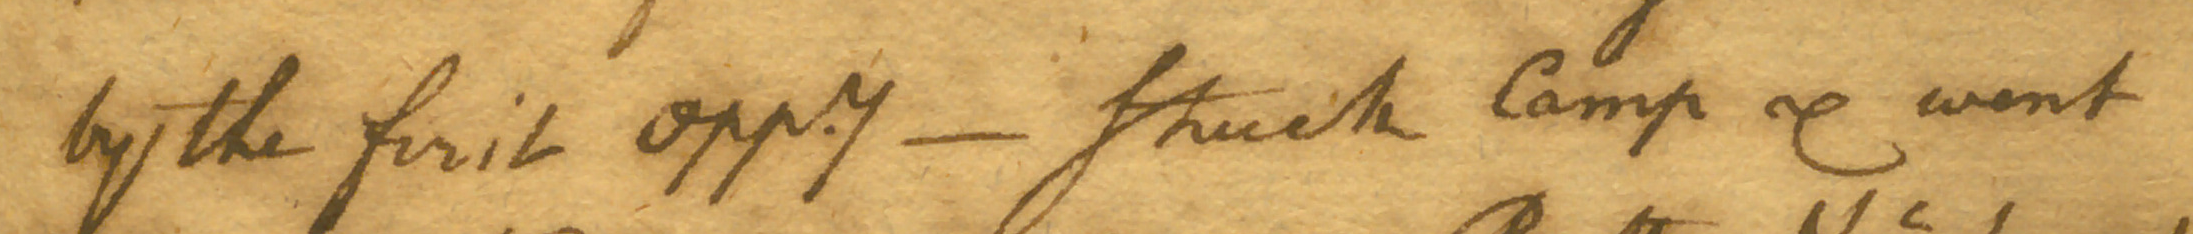by the first opp.y- Struck Camp & went
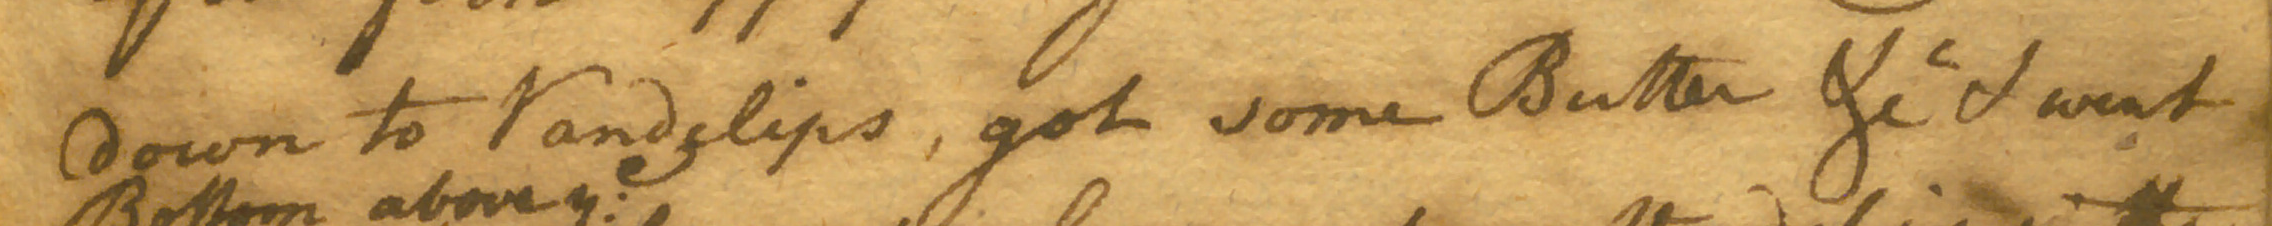down to Vandelips, got some Butter &c^a I went
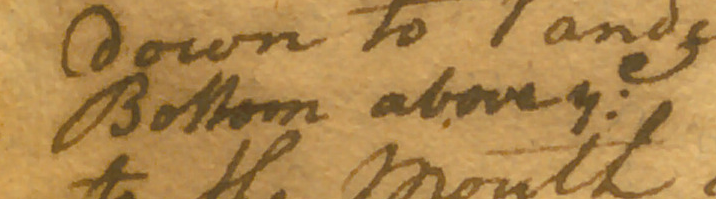Bottom above y^e:
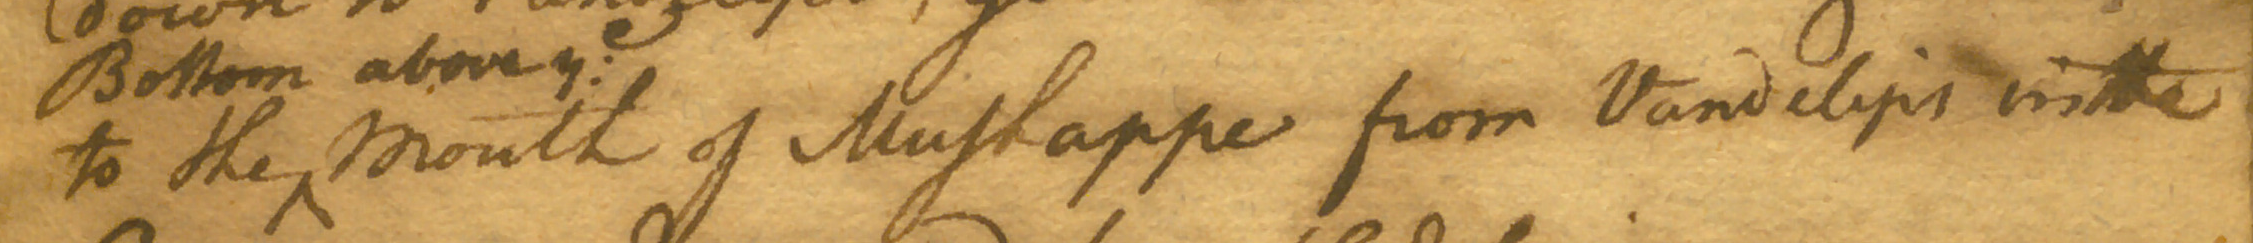to the ^ Mouth of Mushappe from Vandelips in the
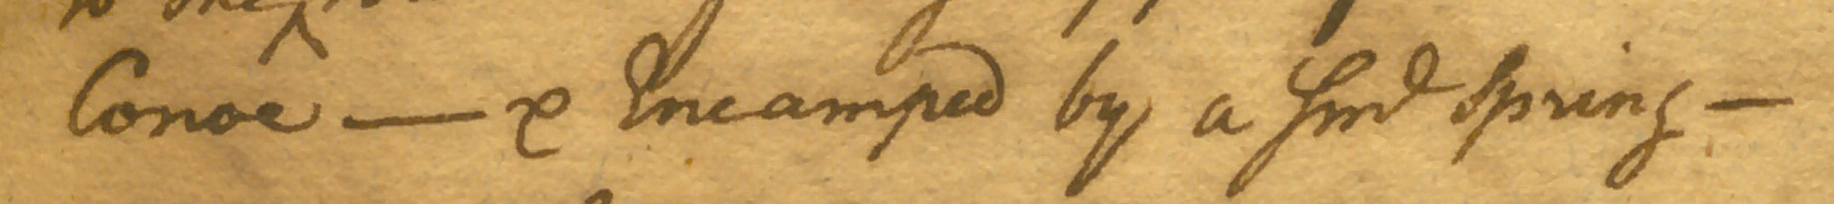Conoe- & Encamped by a sm^l spring-
